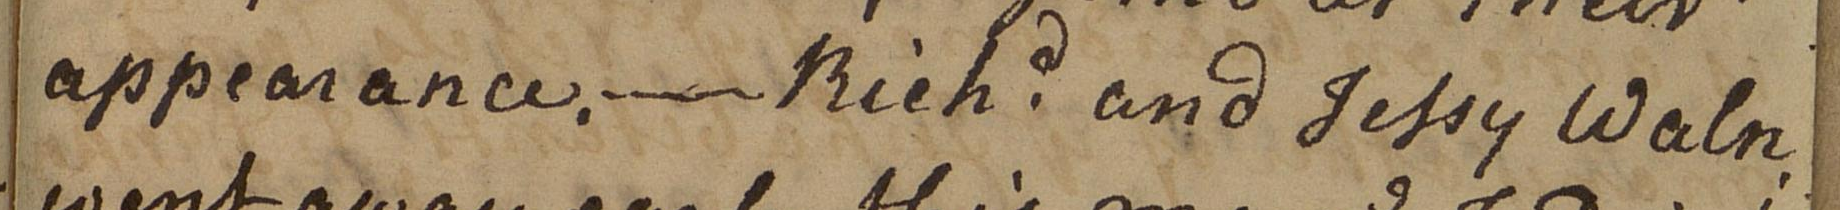appearance,- Rich.^d and Jessy Waln,
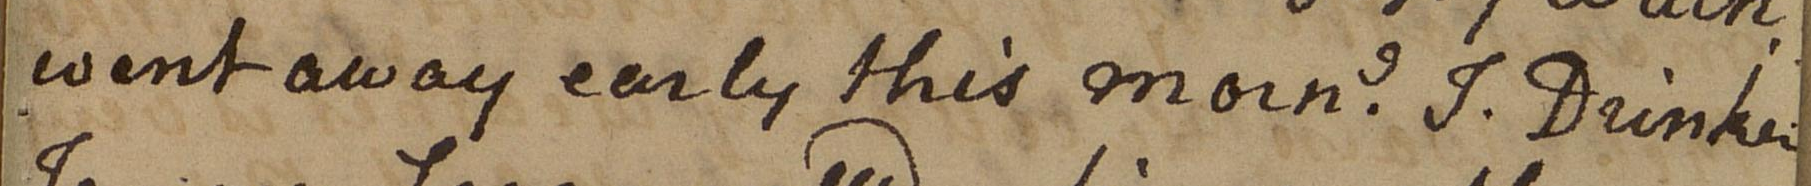went away early this morn.^g. J. Drinker
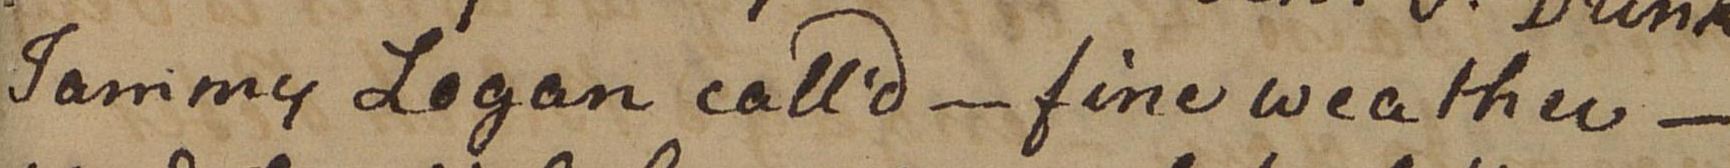Jammy Logan call'd- fine weather-
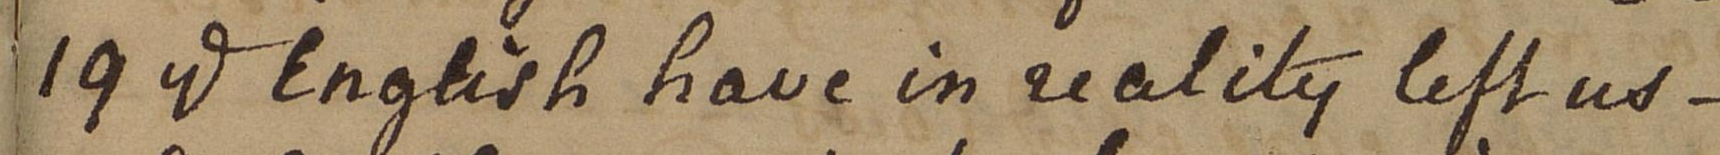19 y^e English have in reality left us-
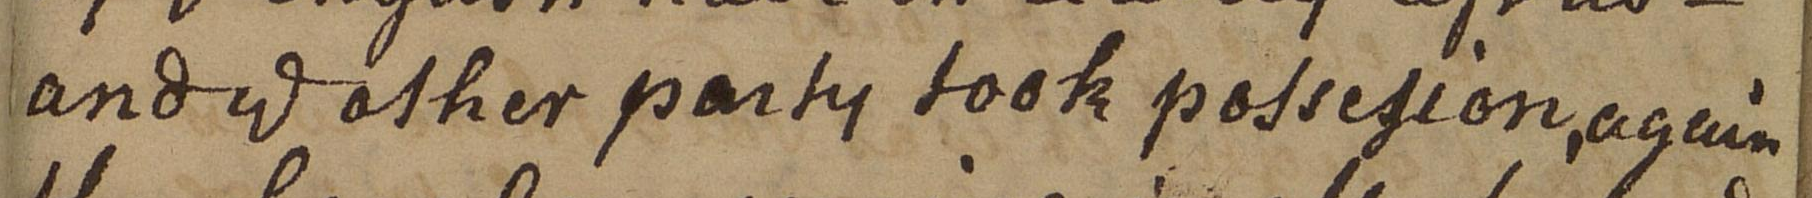and y^e other party took possession, again
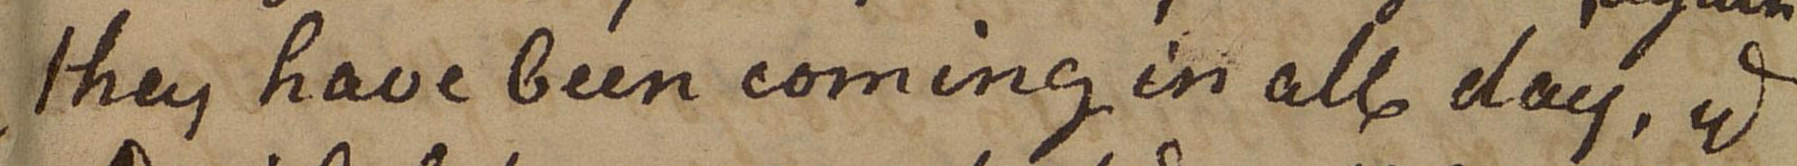they have been coming in all day, y^e
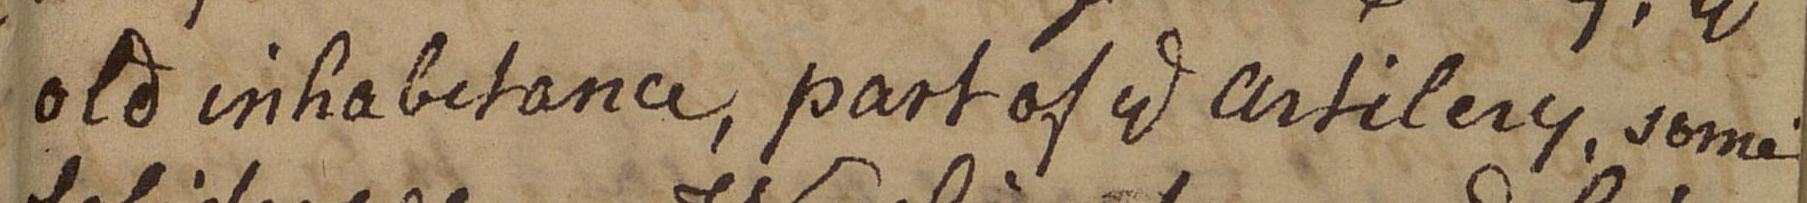old inhabitance, part of y^e Artilery, some
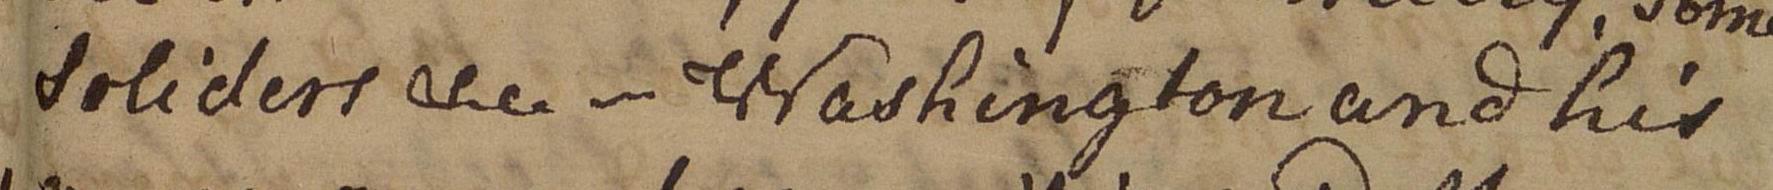Soliders &c- Washington and his
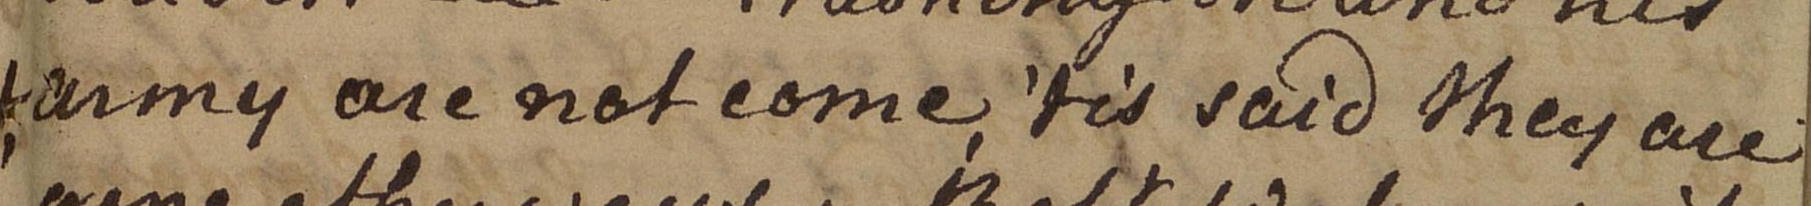army are not come, 'tis said they are
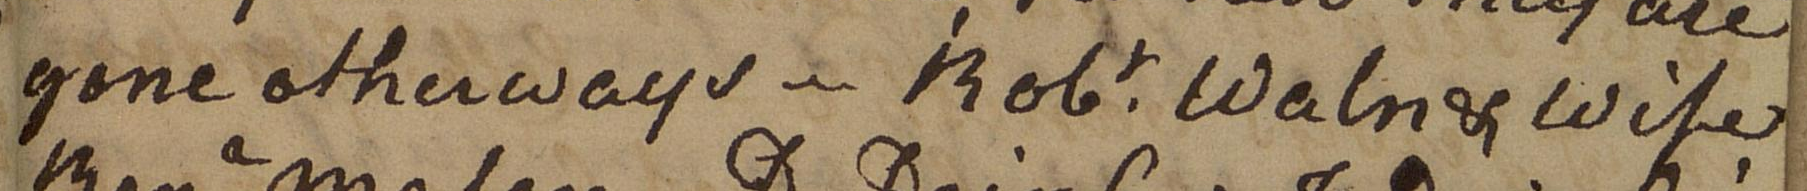gone otherways- Rob^t. Waln & wife
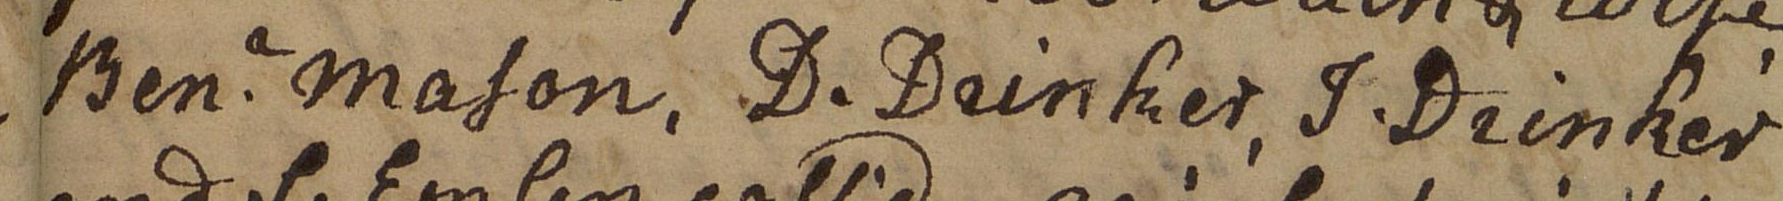Ben^a. Mason, D. Drinker, J. Drinker
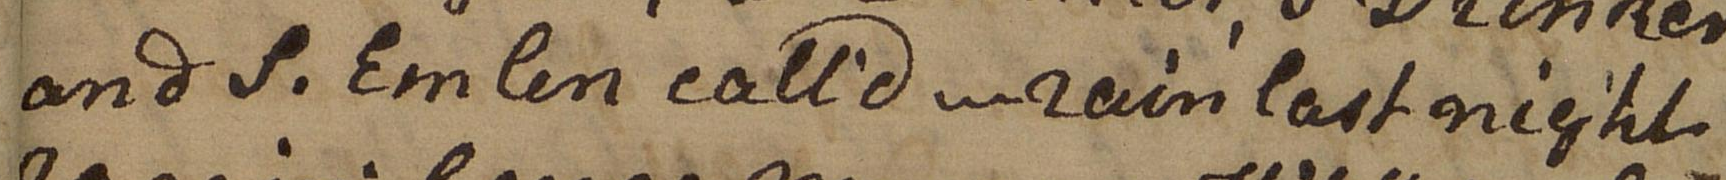and S. Emlen call'd -rain last night
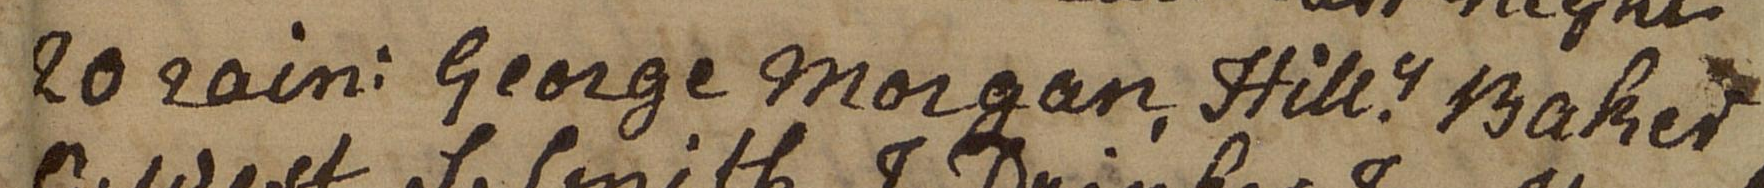20 rain: George Morgan, Hill^y. Baker
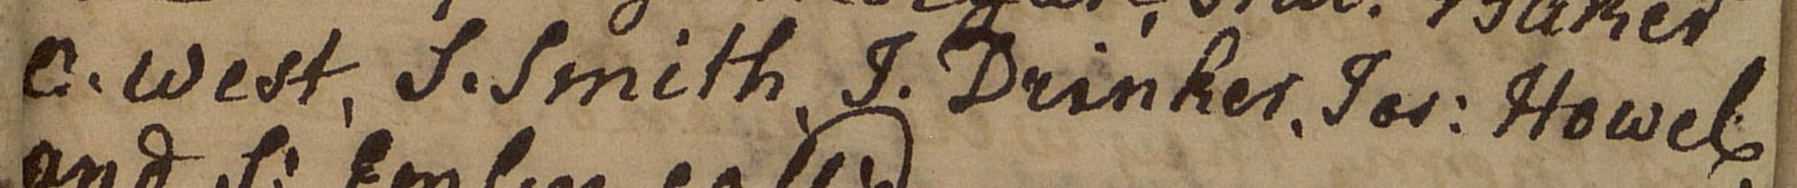C. West, S. Smith, J. Drinker, Jos: Howel
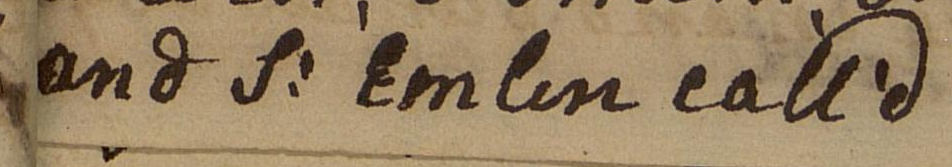and S: Emlen call'd
